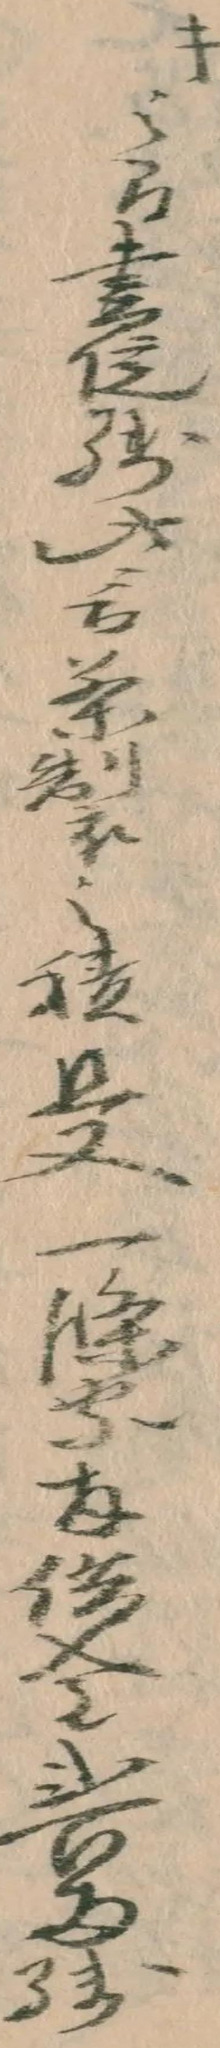キ之間書院残此ニ而茶製之積且又一條家内借金弐百両残
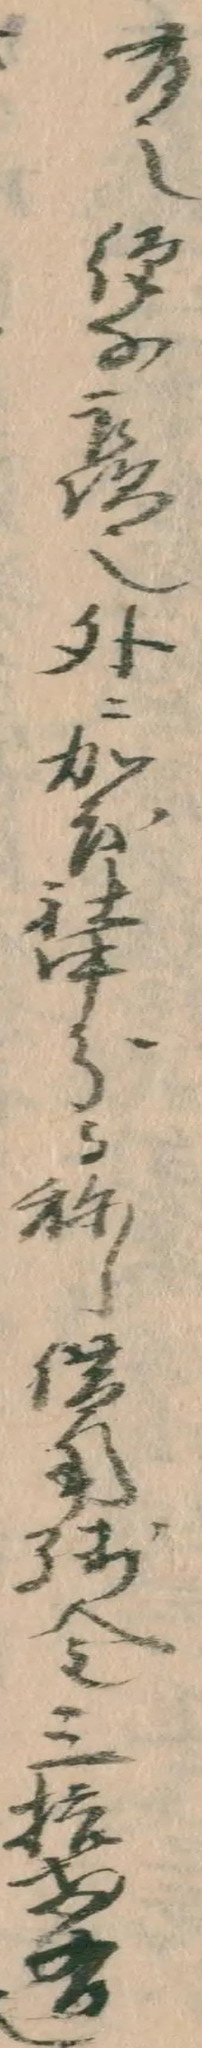有之経千取次也外に加茂社中分と称し借用残金三拾両有之
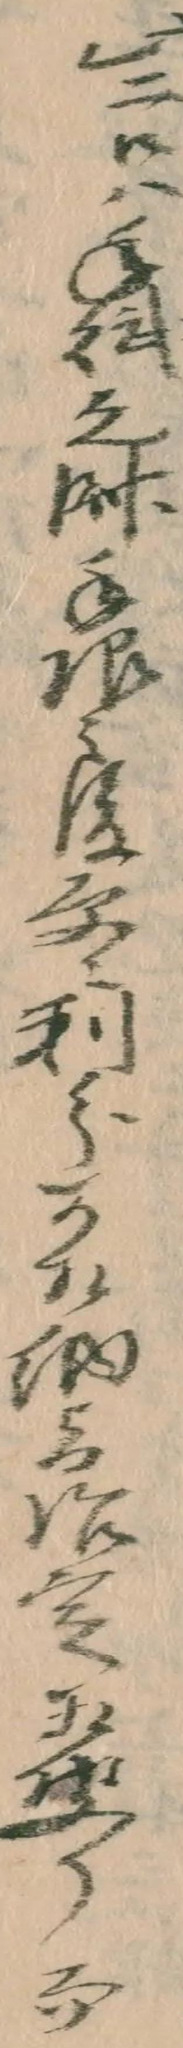此二候ハ年賦元済手限之後更に利分可相納旨治定相決了而
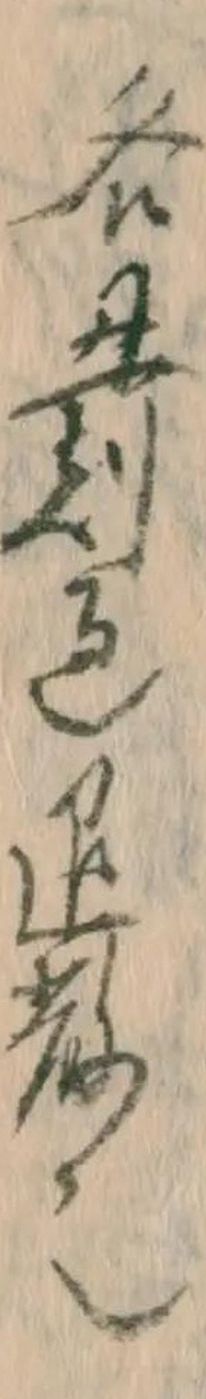各丑刻過退散也
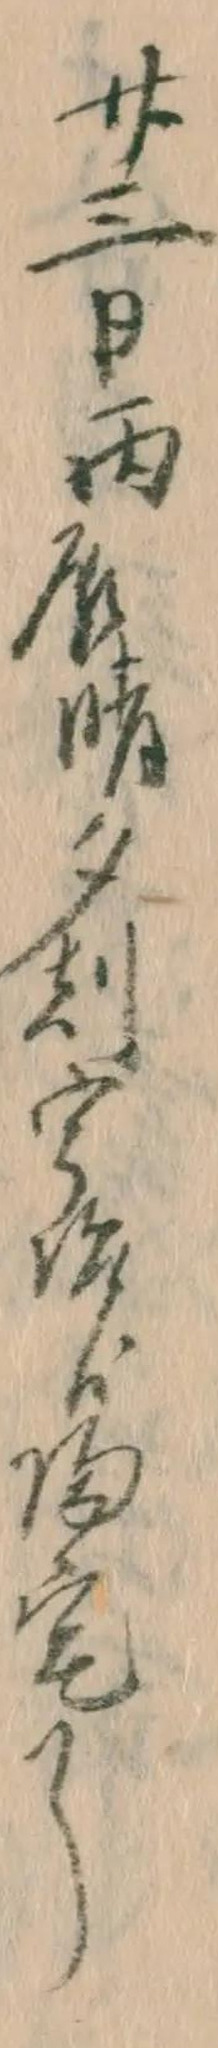廿三日丙辰晴夕刻宇治ゟ帰宅之
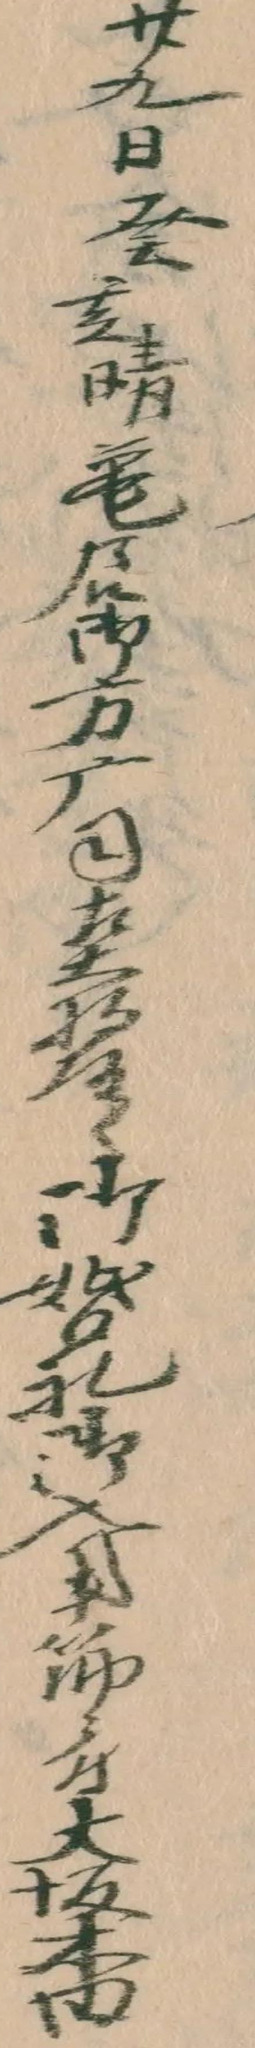廿九日癸亥晴亀君御方鷹司左大将殿ゟ御婚礼御入用筋ニ付大坂木田
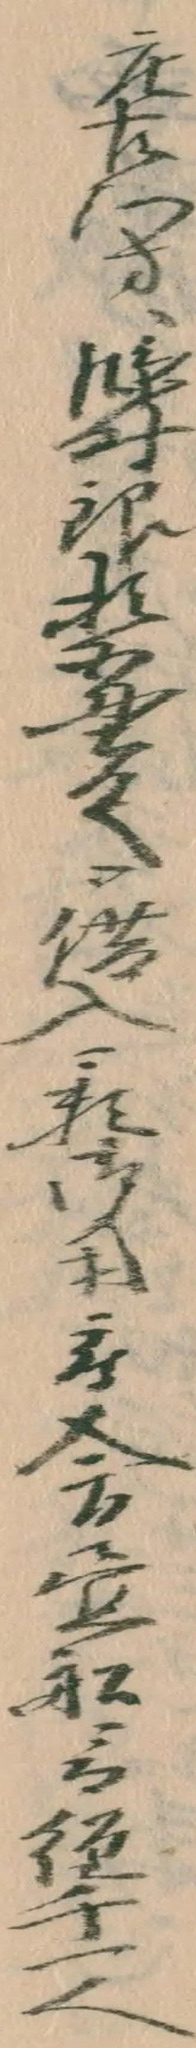庄左衛門方へ臨時銀拾五貫匁御借入御頼御用ニ付今日昼船ニ而従千一人
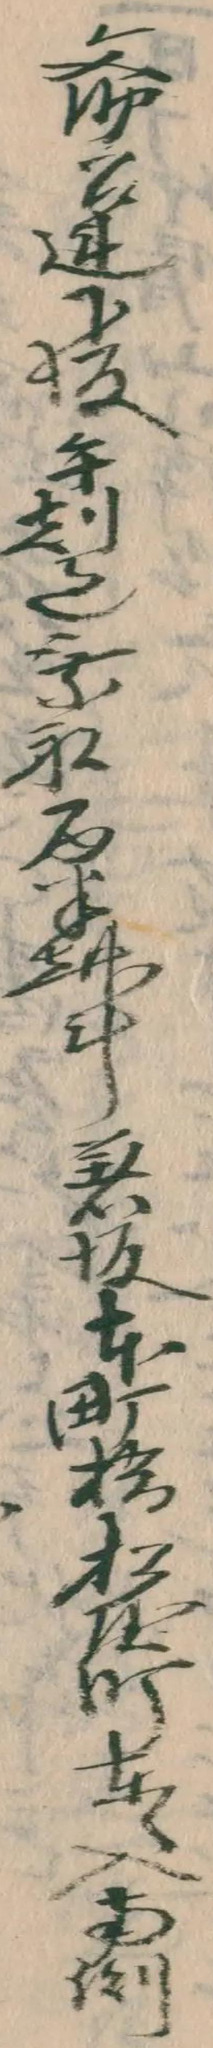文助召連下坂午刻過乗舩酉半刻斗着坂本町松屋町東へ入南側
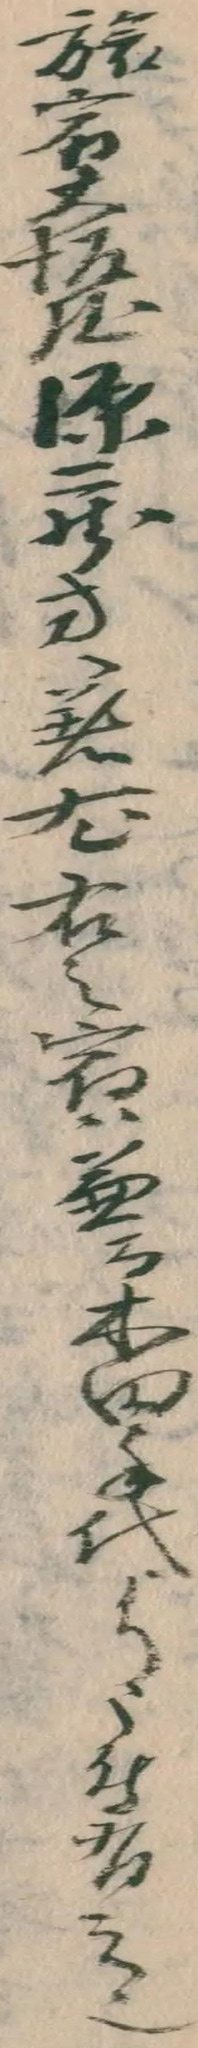旅宿大坂屋源蔵方へ着尤右之宿ハ兼而木田手代より申付有之也
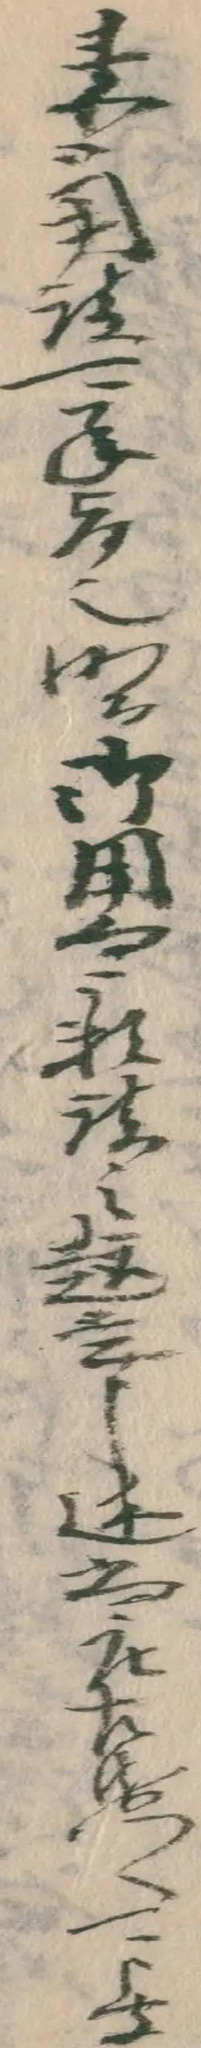来御用請可承知也仍而御用向頼請之趣意申達而庄左衛門へ可申聞
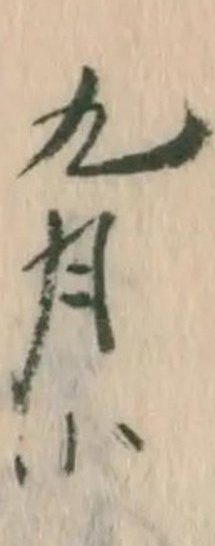九月小
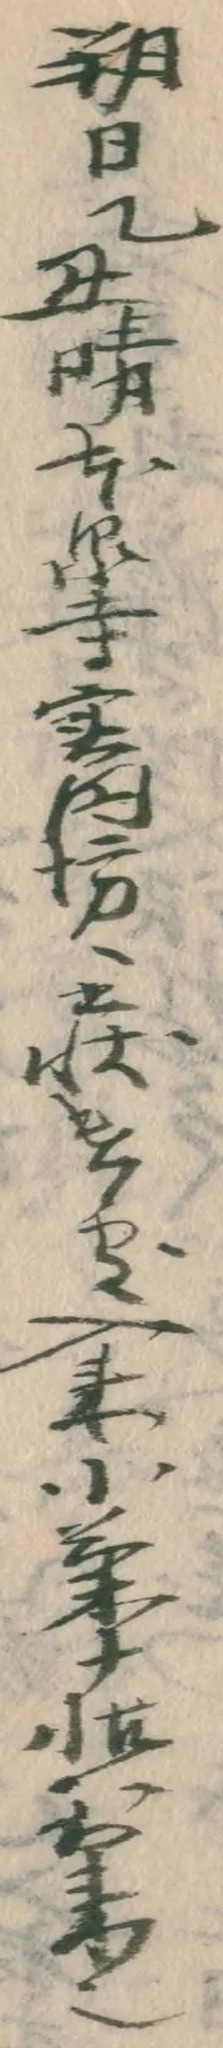朔日乙丑晴本泉寺実円方へ書状遣候處入来小菊十帖到来也
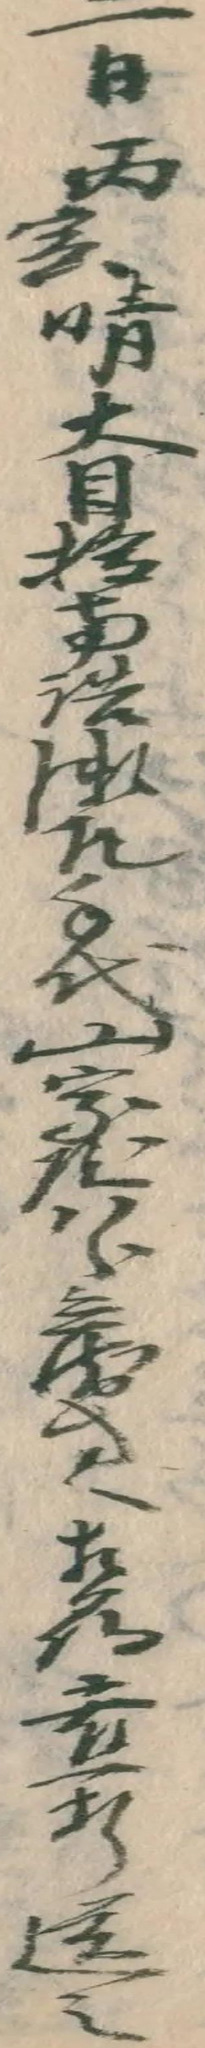二日丙亥晴大目指南詰瀬尾手代山家尾八郎兵衛方へ相尋煮折送之
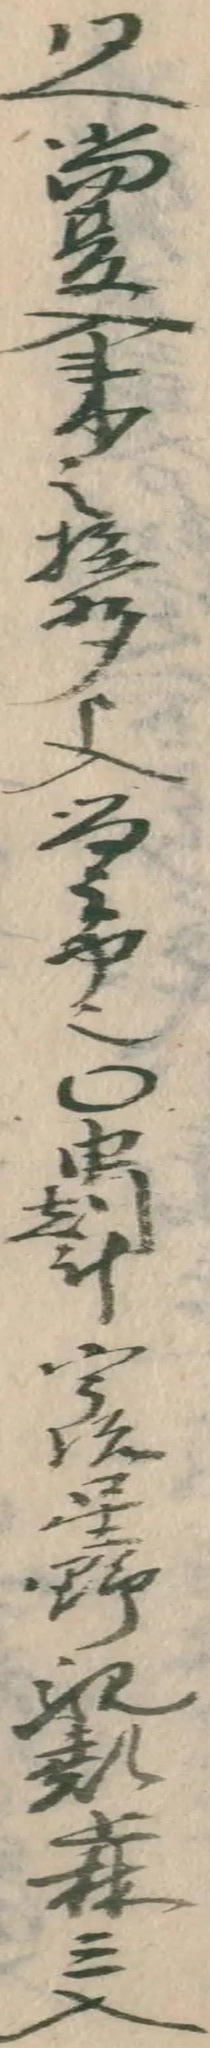同人當夏入来之挨拶申入留守中也○申刻斗宇治星野親類上林三入
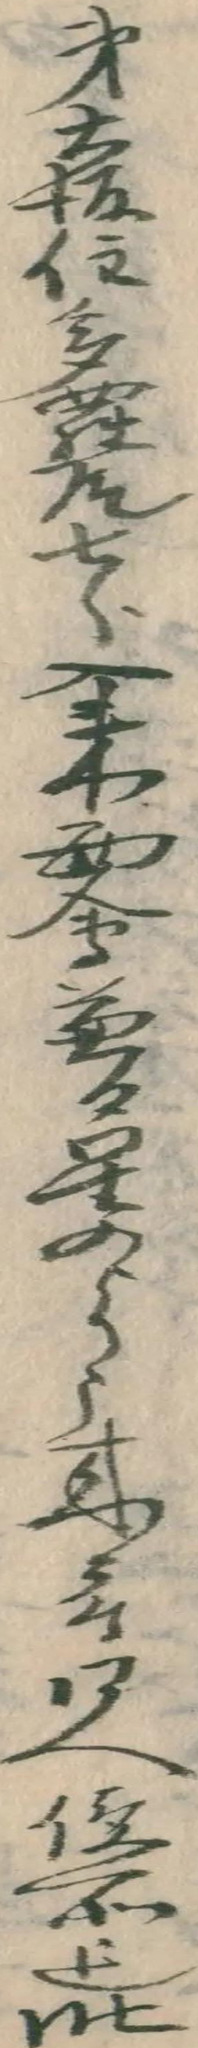弟大坂住多羅尾七郎入来面會兼而星のより申来ニ付同人便所迄昨
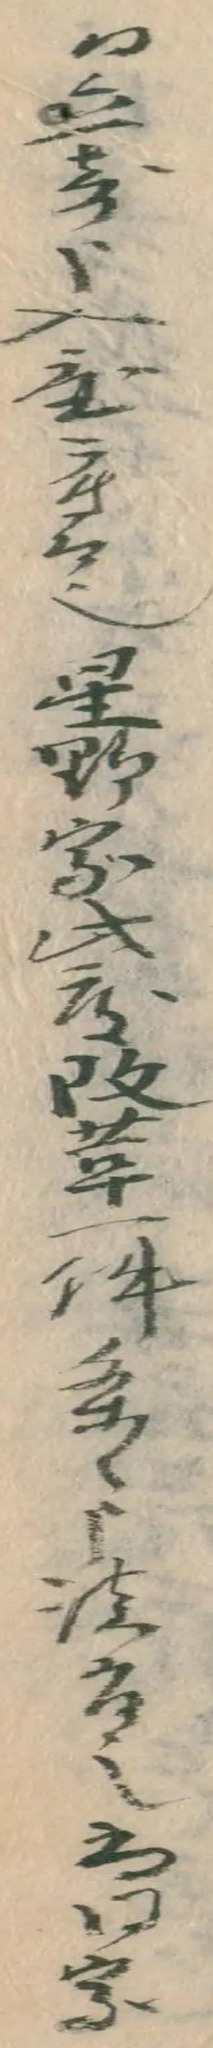日立寄申入置ニ付而也星野家此度改革一件条々申談有之尚同家
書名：賀茂社記録. 第69冊
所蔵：国立国会図書館 National Diet Library, JAPAN
